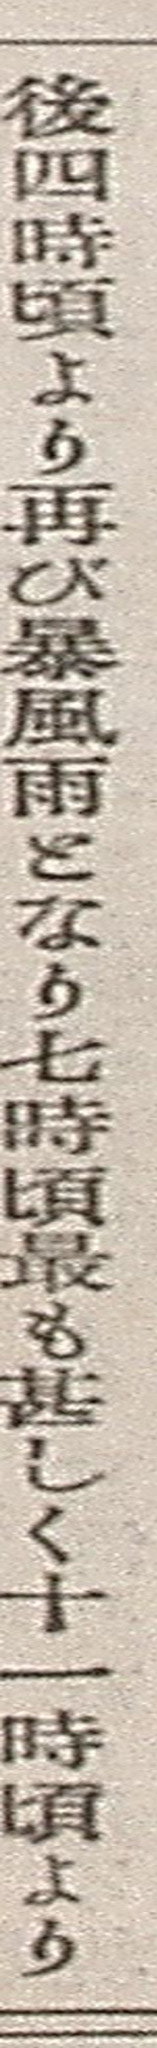後四時頃より再び暴風雨となり七時頃最も甚しく十一時頃より
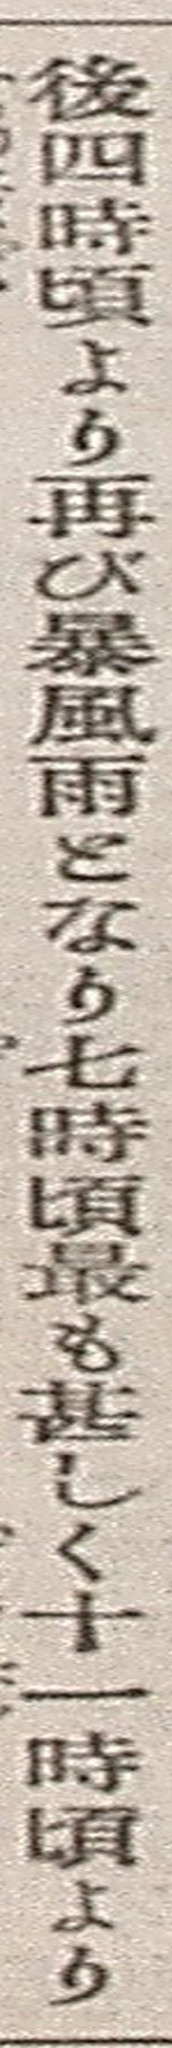後四時頃より再び暴風雨となり七時頃最も甚しく十一時頃より
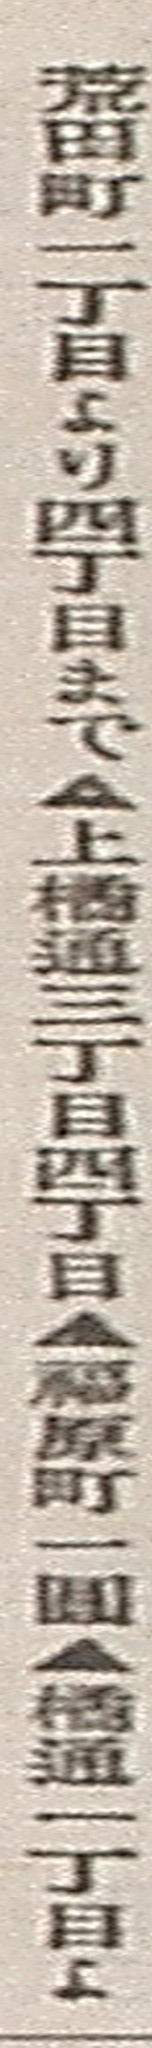荒田町一丁目より四丁目まで▲上橘通三丁目四丁目▲福原町一圓▲橘通一丁目よ
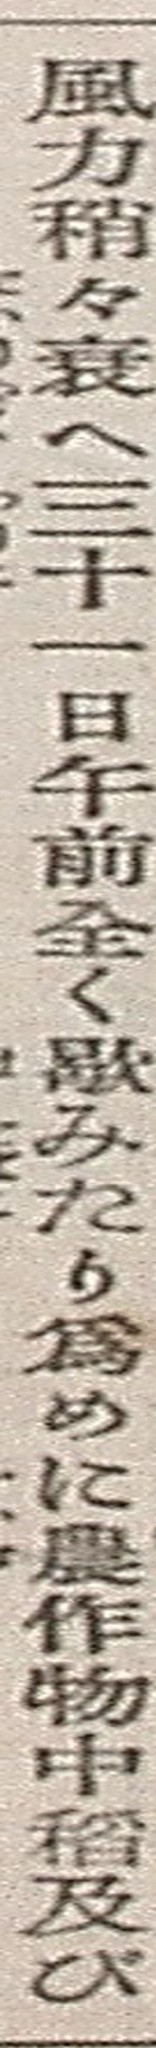風力稍々衰へ三十一日午前全く歇みたり為めに農作物中稲及び
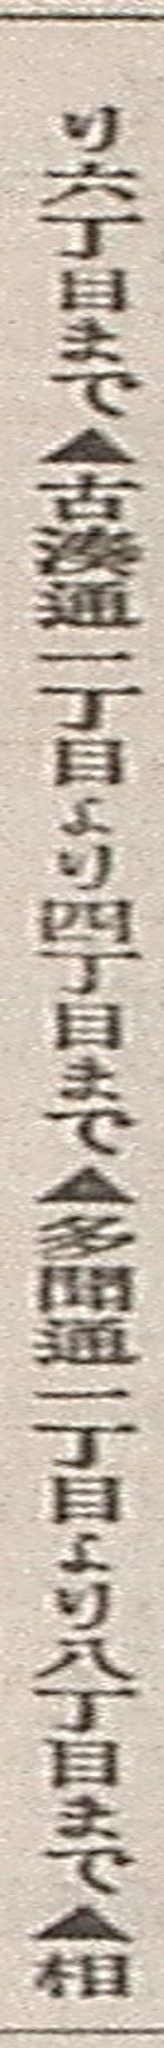り六丁目まで▲古湊町一丁目より四丁目まで▲多聞通一丁目より八丁目まで▲相
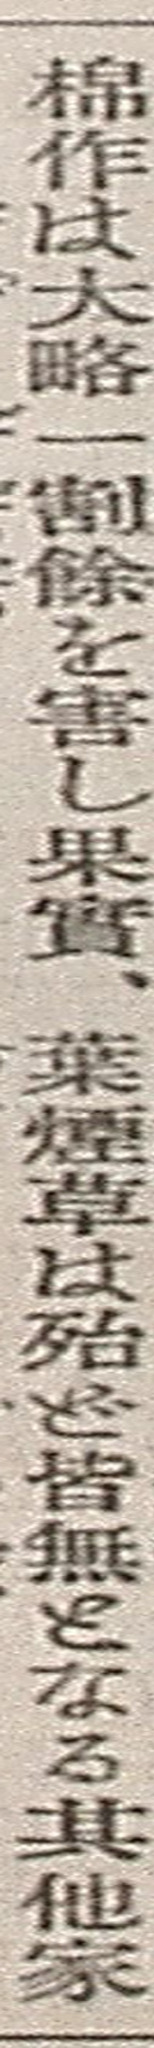棉作は大略一割餘を害し果実、葉煙草は殆ど皆無となる其他家
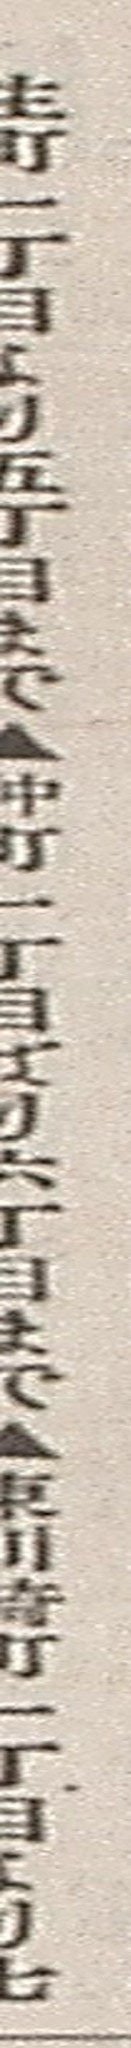生町一丁目より五丁目まで▲仲町一丁目ばり六丁目まで▲東川崎町一丁目より七
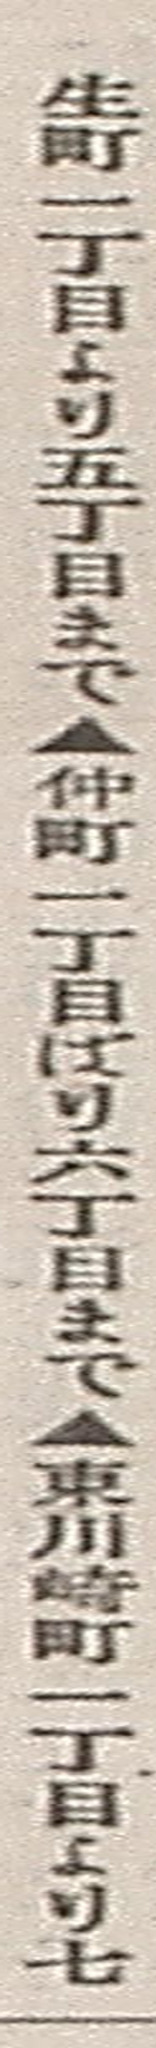生町一丁目より五丁目まで▲仲町一丁目ばり六丁目まで▲東川崎町一丁目より七
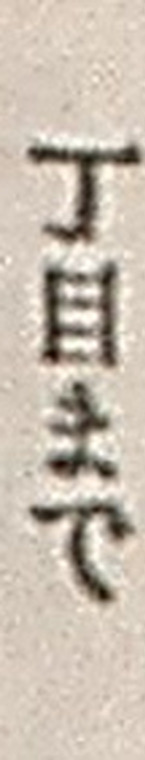丁目まで
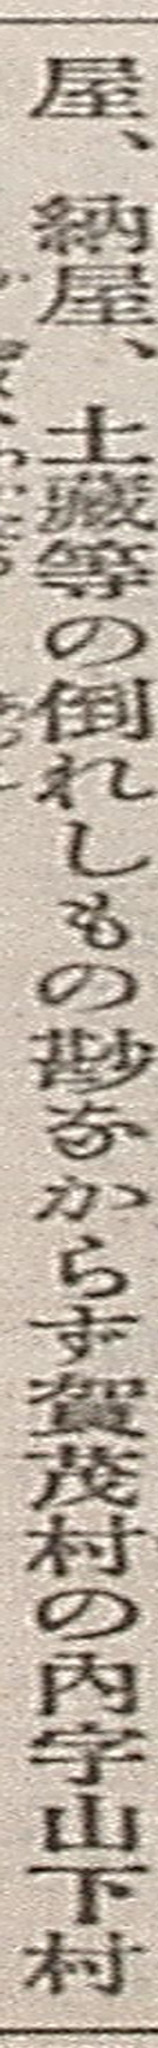屋、納屋、土蔵等の倒れしもの尠なからず加茂村の内字山下村
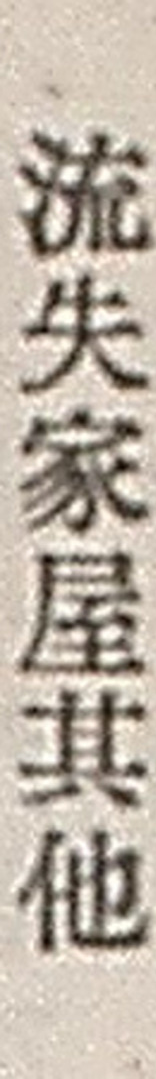流失家屋其他
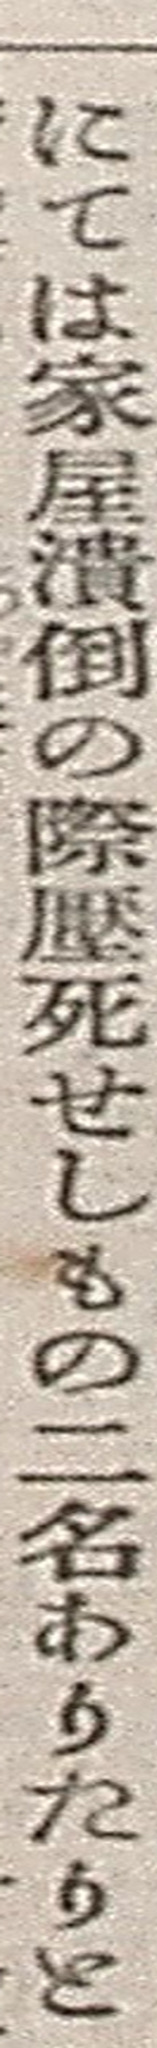にては家屋潰倒の際壓死せしもの二名ありたりと
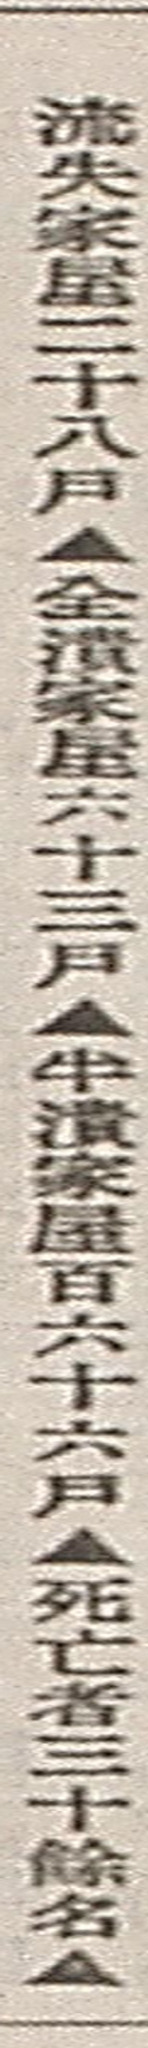流失家屋二十八戸▲全潰家屋六十三戸▲半潰家屋百六十六戸▲死亡者三十餘名▲
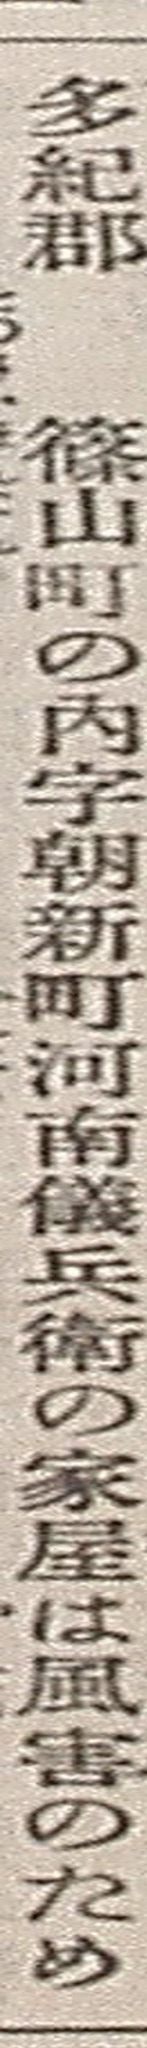多紀郡篠山町の内字朝新町河南儀兵衛の家屋は風害のため
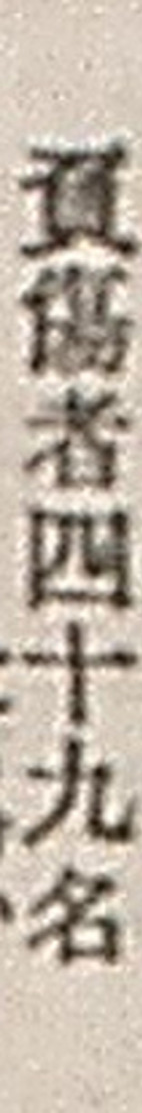負傷者四十九名
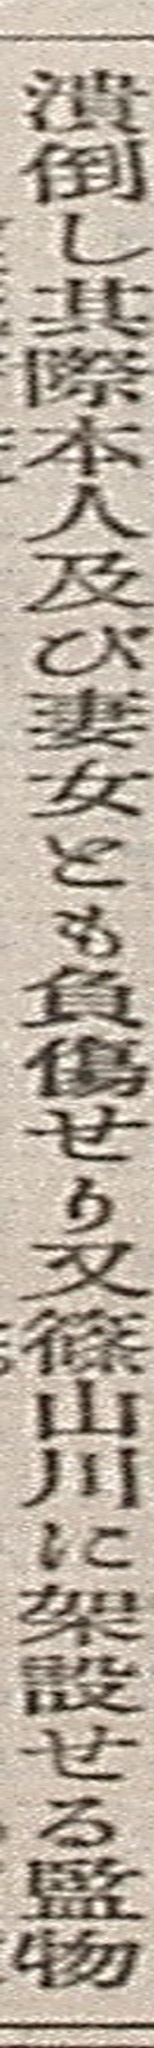潰倒し其際本人及び妻女とも負傷せり又篠山川に架設せる監物
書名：風俗畫報臨時増刊第百二十八號　洪水被害録（下）
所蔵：東京大学地震研究所図書室 Earthquake Research Institute Library, The University of Tokyo, JAPAN
